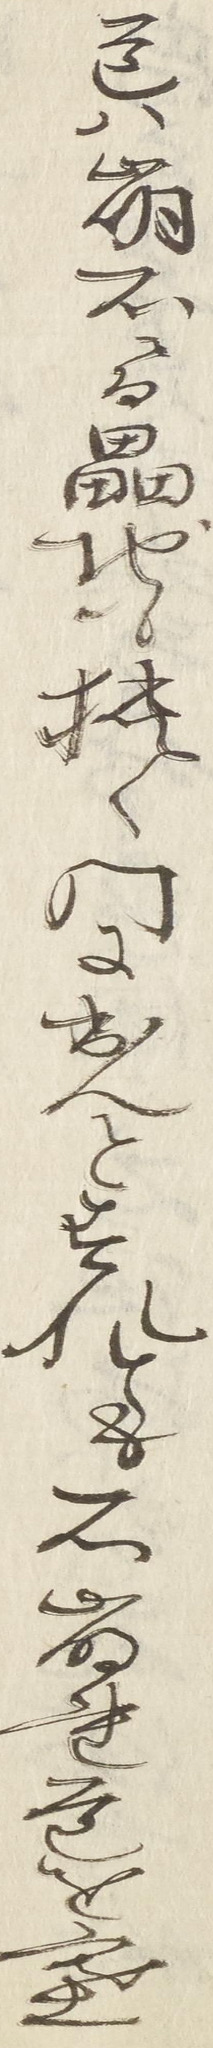道は崩石二而畾地も狭く門に出んとすれとも石崩れ道を塞
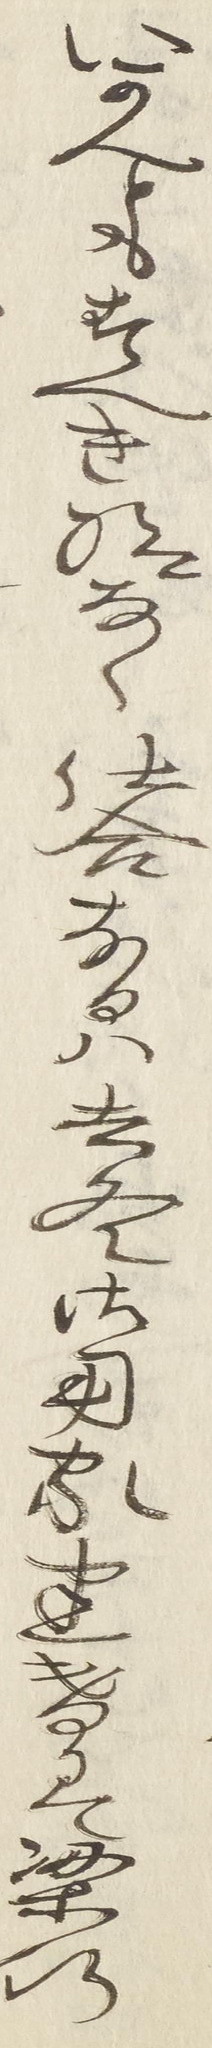いかんともすへき様なく仕合なるは去冬御用家建替にて梁行
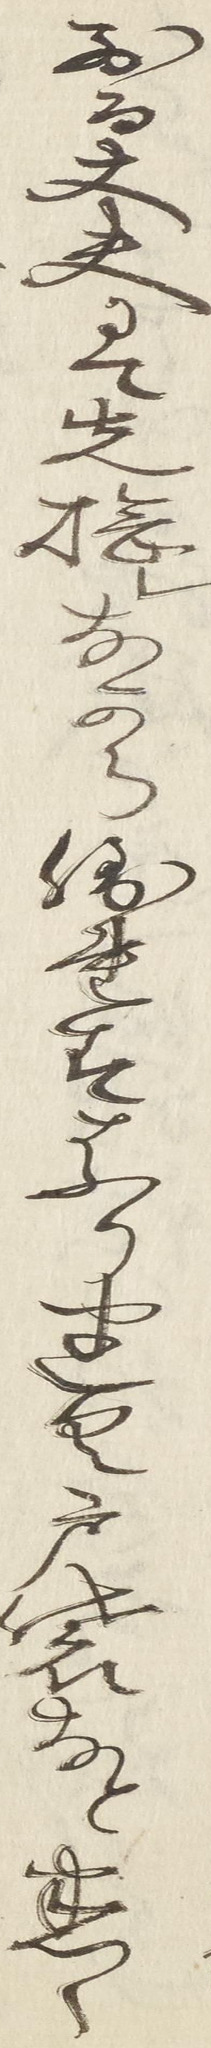別而丈夫にて先捻ㇾなから倒れすはかり建具戸袋なと悉く
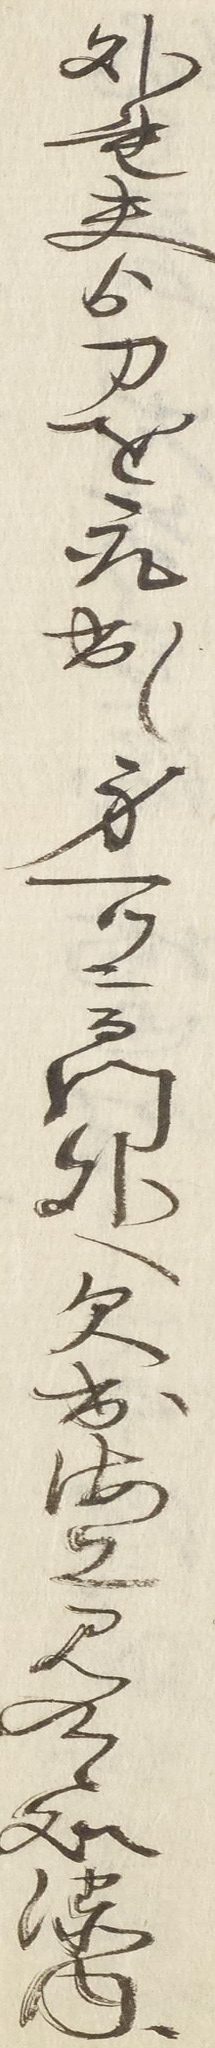外れ夫ゟ刀を取出し身一ッ二而門外へ欠出海之見合候処湊内二
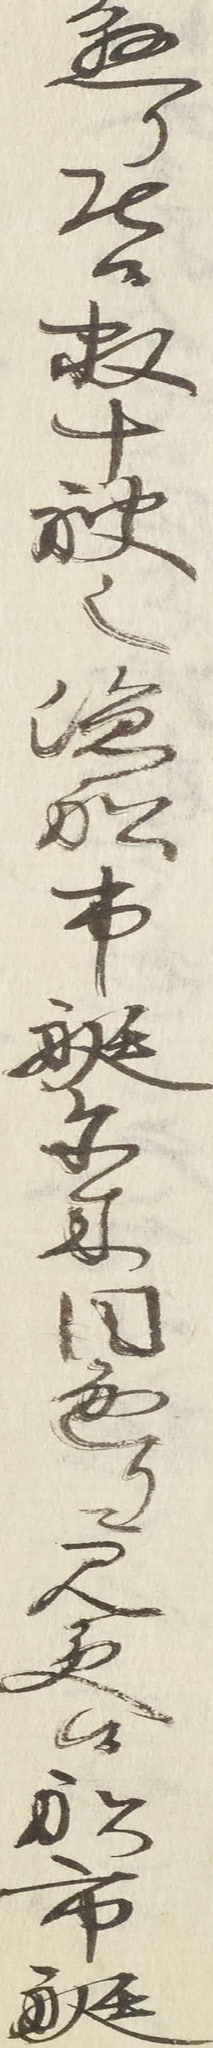懸り居候数十艘之漁船市艇示來目通りに見受候船市艇
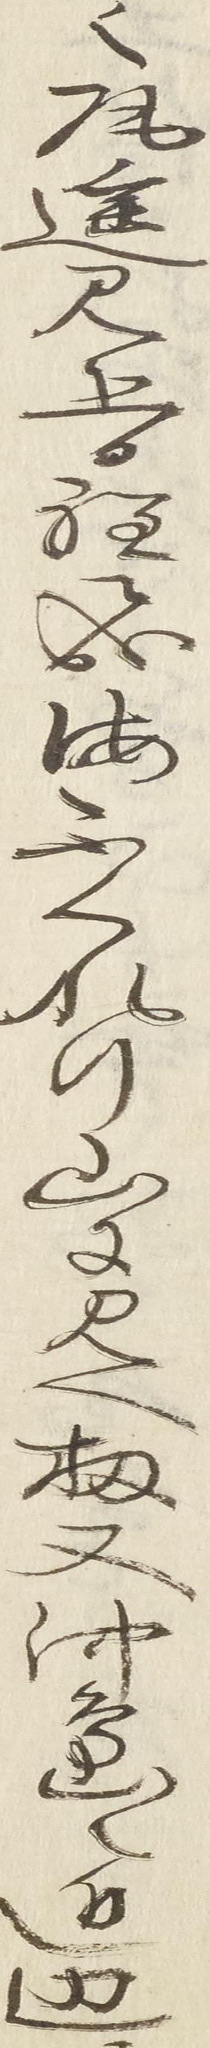之瓦遥見上る程に成海ふくれり山に見へ扨又沖嶋之近辺二
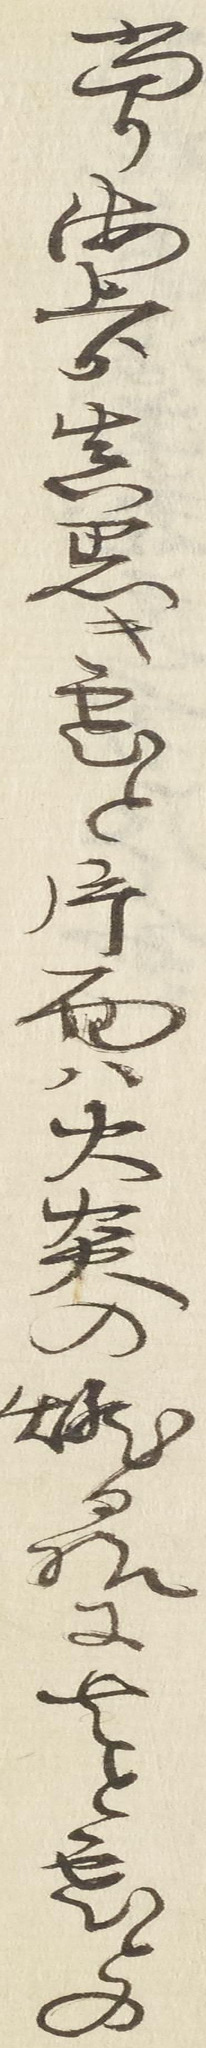当り海上ゟ真黒き雲と片面は火炎の焼る様にはと雲との
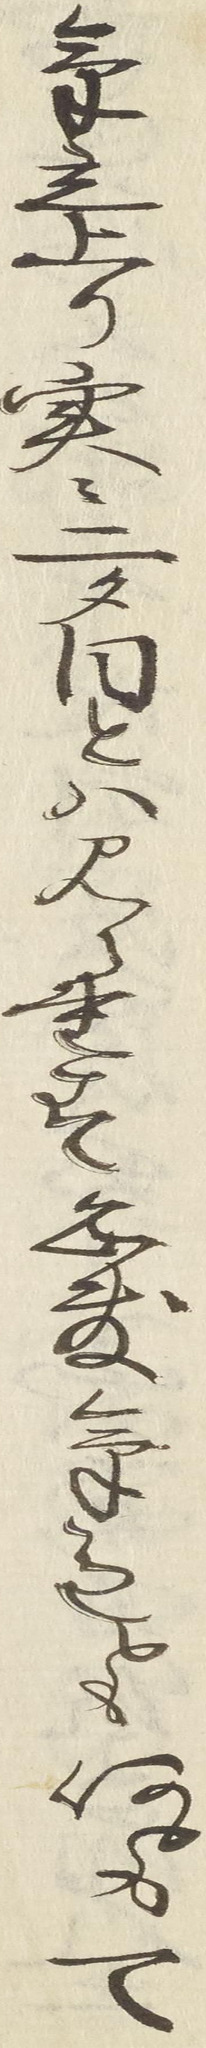気立上り実に二タ目とは見られす恐敷気過とも何かもて
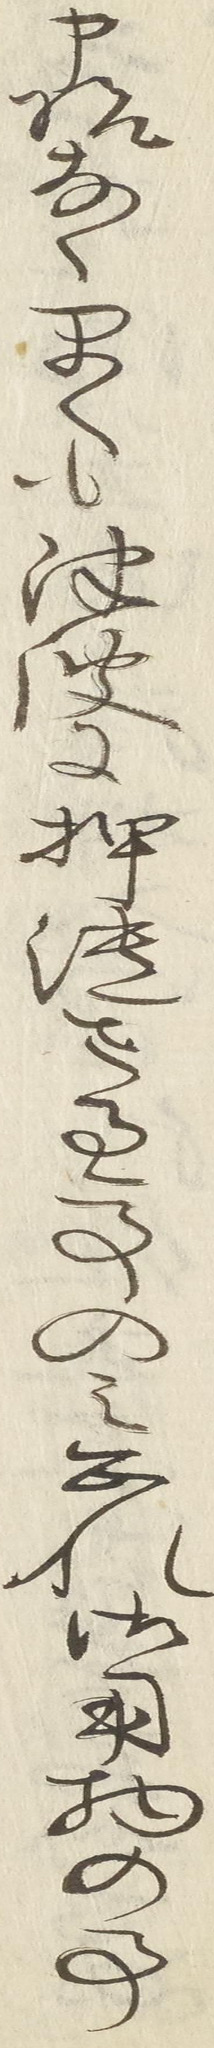申様なく早くも津波に押潰さる事のみ恐れ御用物の事
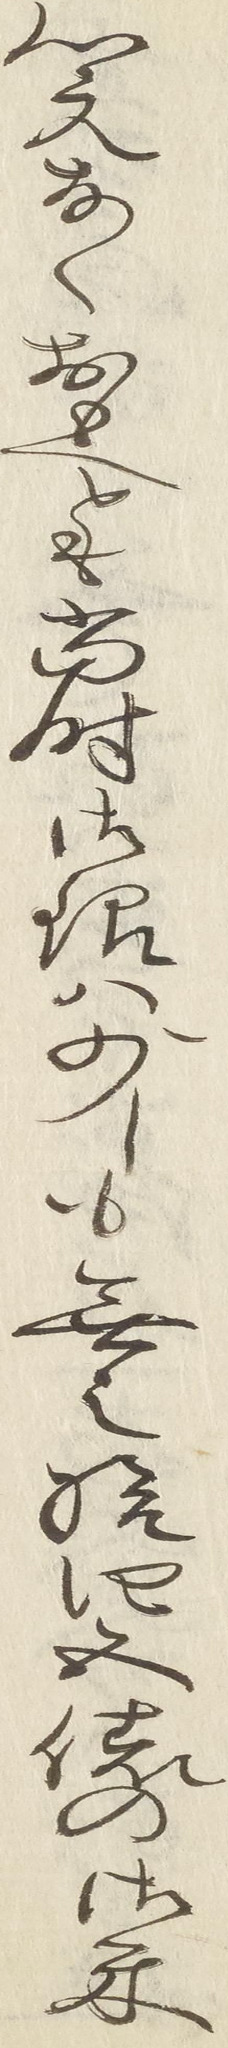心元なくおもへとも当時御銀は少しも無之拾四五俵の御米
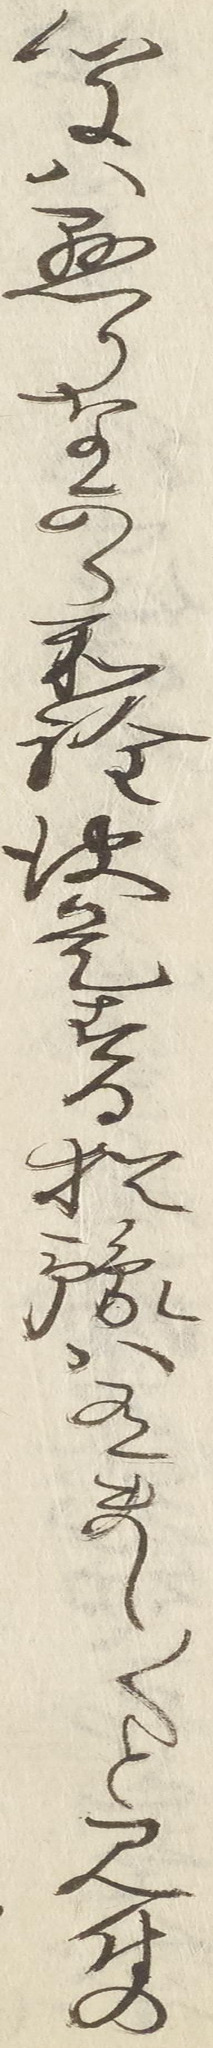心には懸りなから所詮彼是する猶予は有ましくと見付の
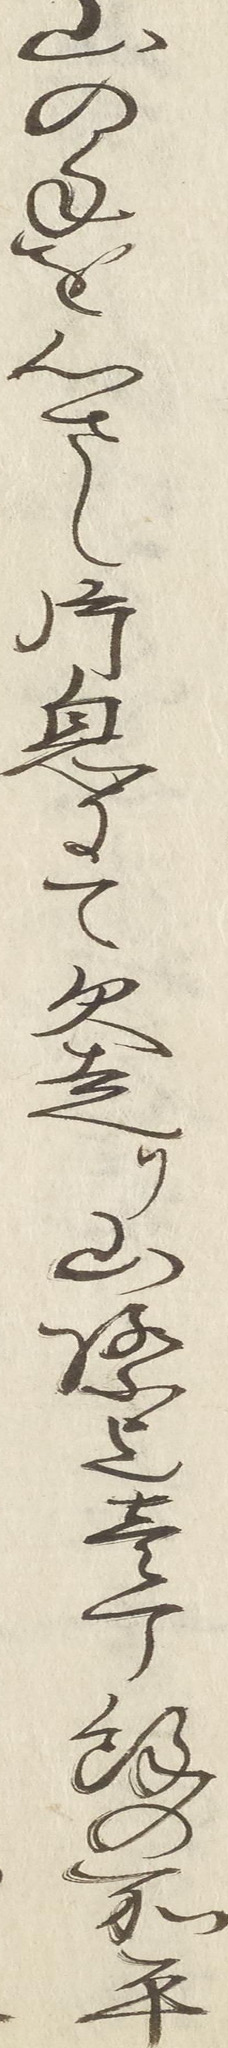山の手を心さし片息にて欠走り山際迄壱丁餘の所平
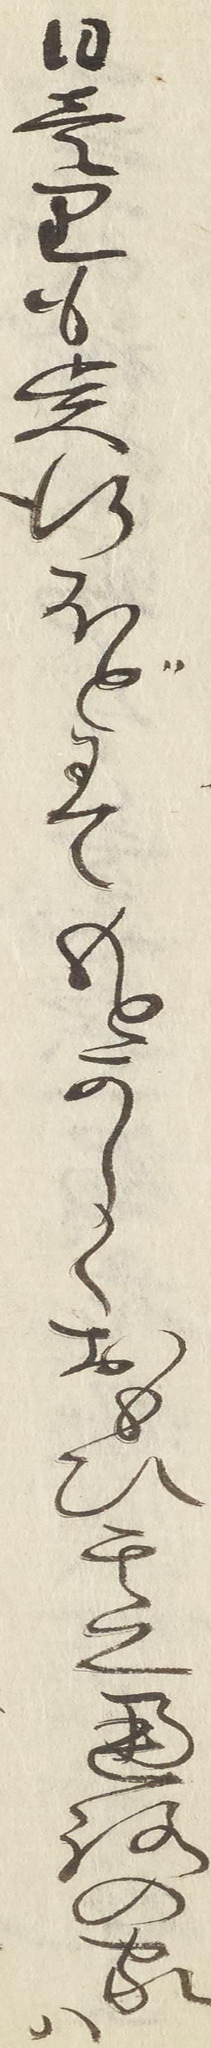日壱里も歩行ほどにてもとかしくおもひ其上通路の家は
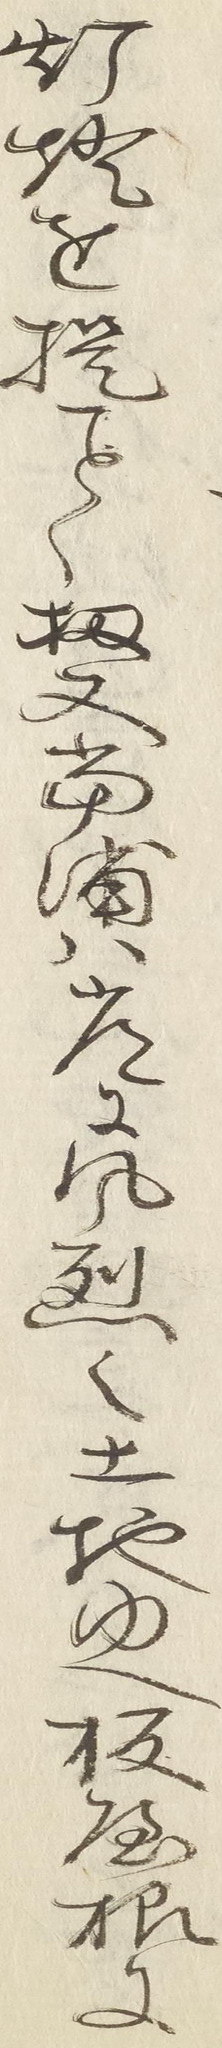灯燈を提ことく扨又当浦は常に風烈く土地ゆへ板屋根に
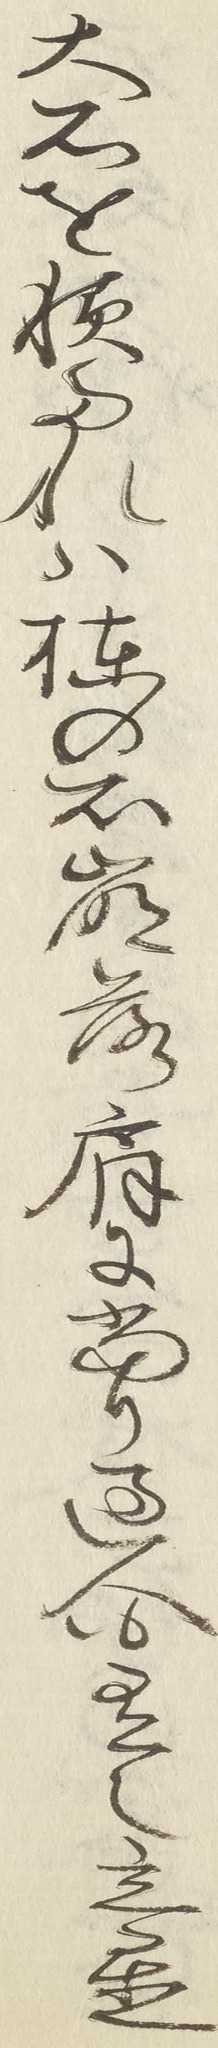大石を横たれは棟の石崩落肩に当り通人も有之立置
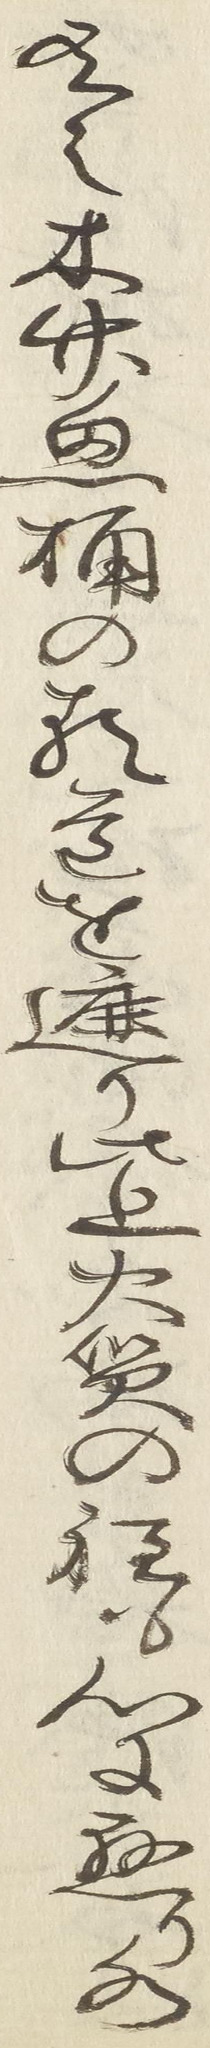有之木竹魚桶の類道を遮り此上火災の程も心に懸り水
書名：地震記　下
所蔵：東京大学地震研究所図書室 Earthquake Research Institute Library, The University of Tokyo, JAPAN
